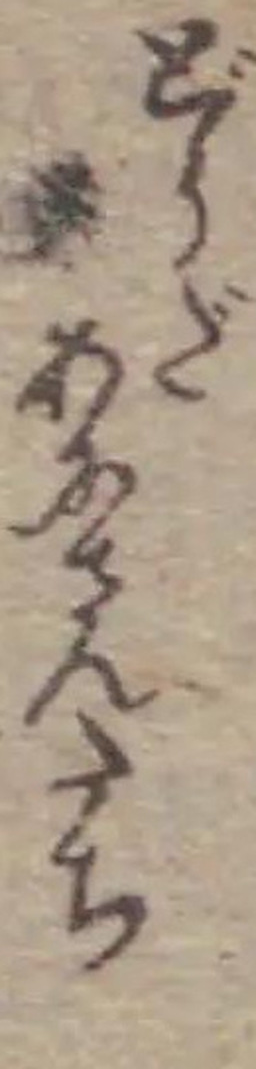あにさんたち
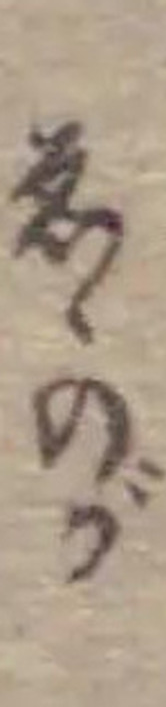ゑゝのが
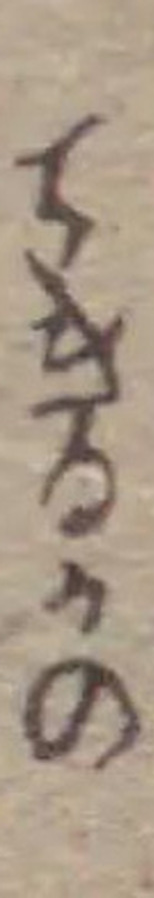てきるかの

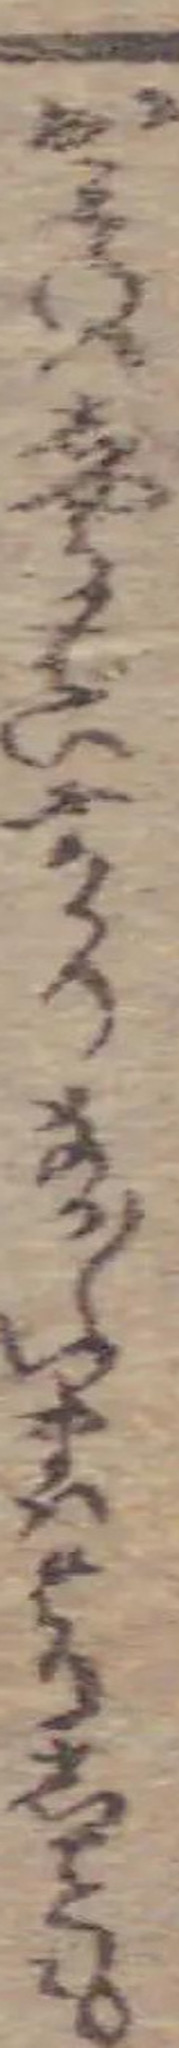おみねはしやうばいにかゝりなか〳〵いまははりしことも
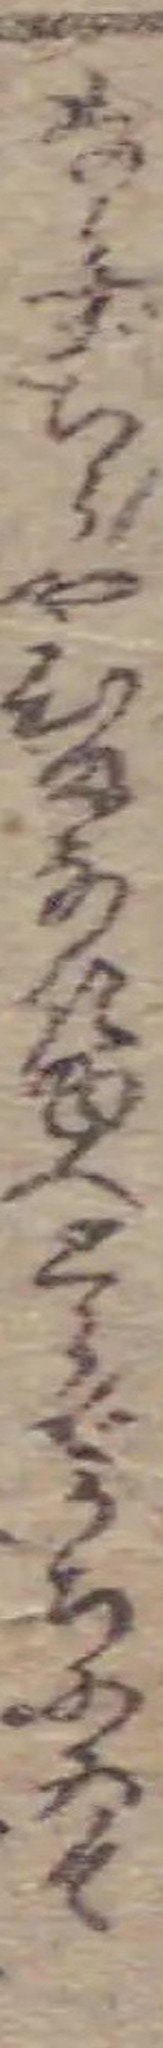ならずちうやひまなきゆへとうでうちにゐて
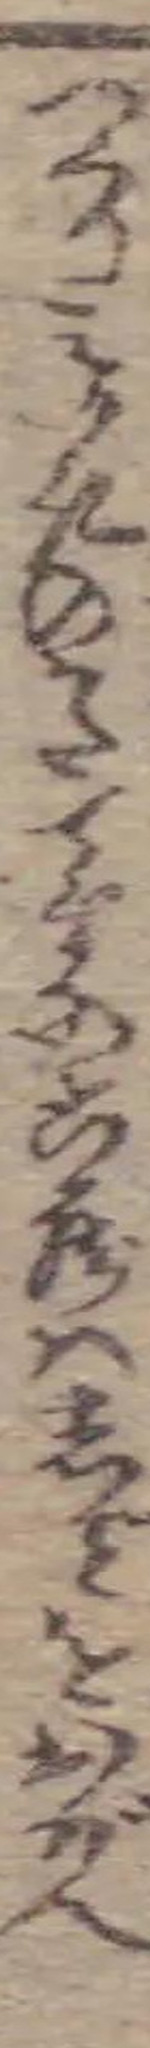つくりみかきのかたてまに六蔵はしごとをおぼへ
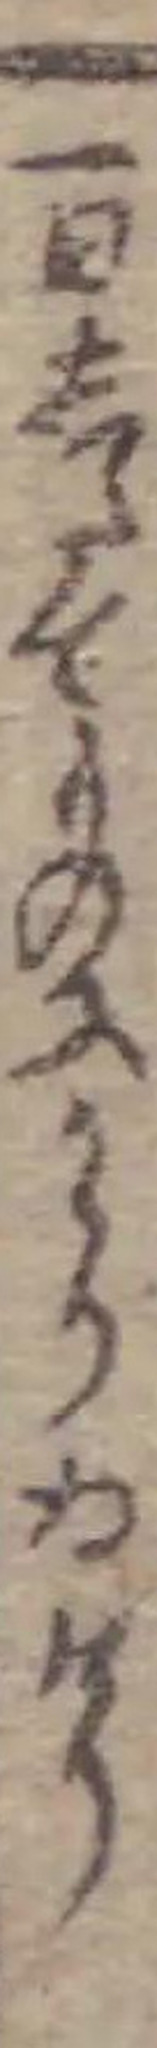一日したてものにかゝりゐけり
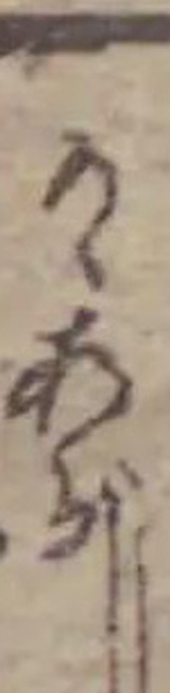かゝあが
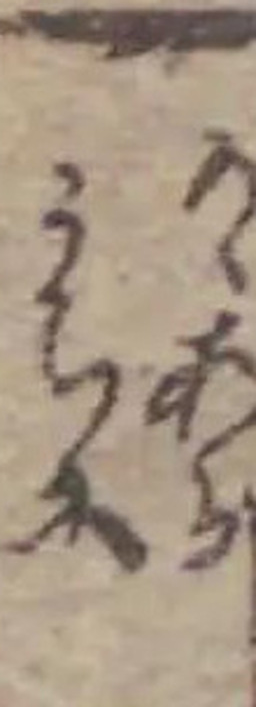うちに
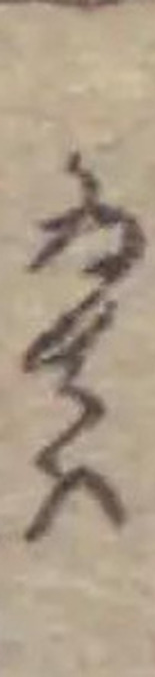ゐては
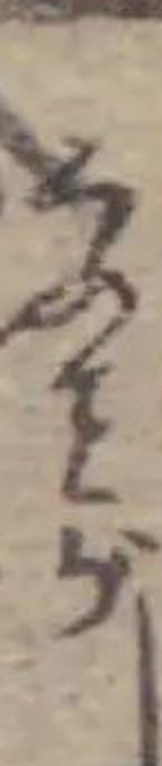くふことが
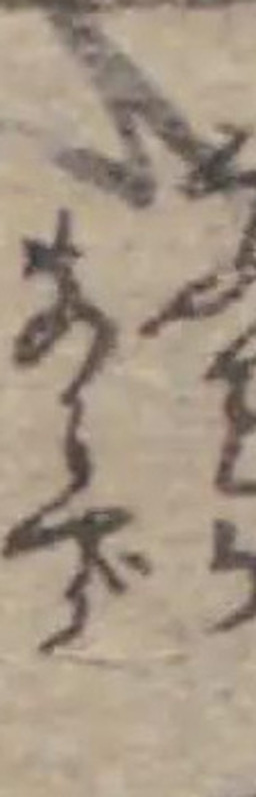ならず
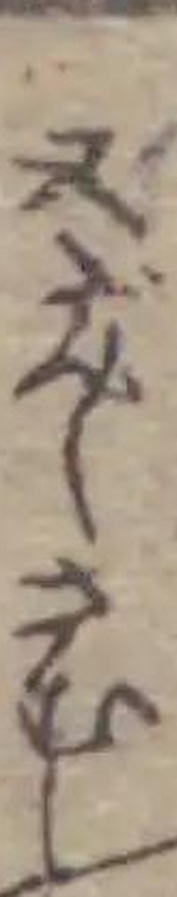又たん〳〵さむ
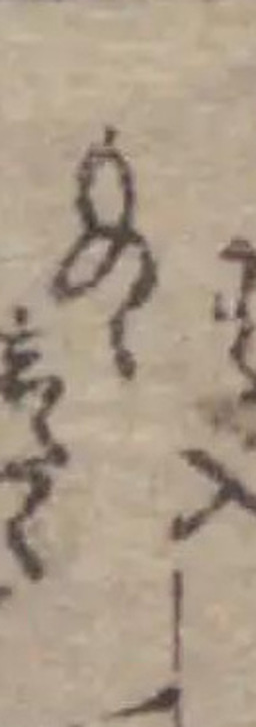ものゝ
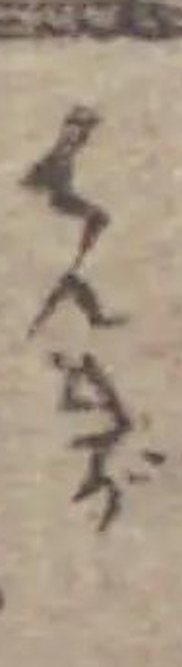てんきが
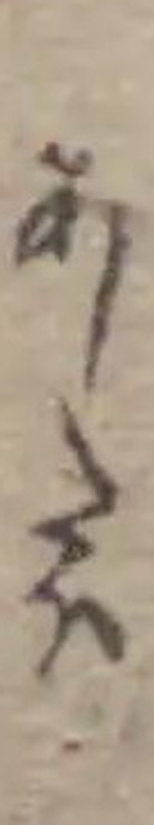あしたは
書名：飛た間違矢口噂 2巻
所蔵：国立国会図書館 National Diet Library, JAPAN
